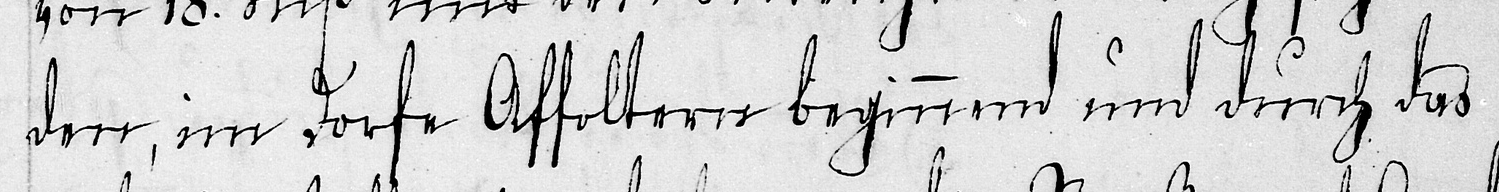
den, im Dorfe Affoltern beginnend und durch das
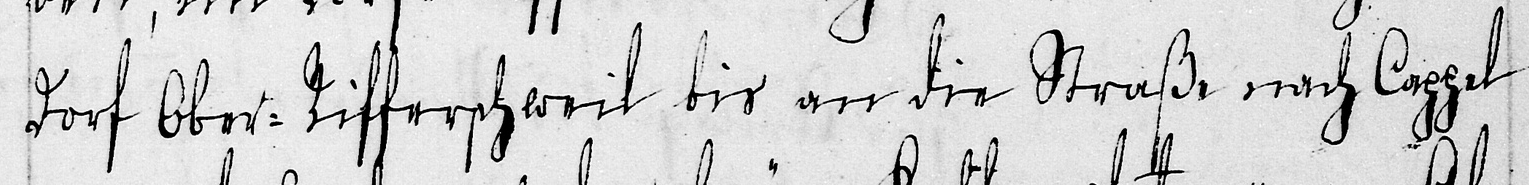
Dorf Ober-Rifferschweil bis an die Straße nach Cappel
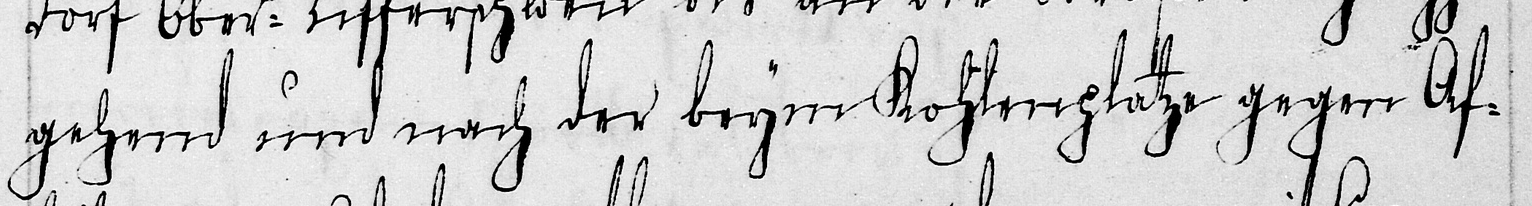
gehend und nach der beym Kohlenplatze gegen Af¬
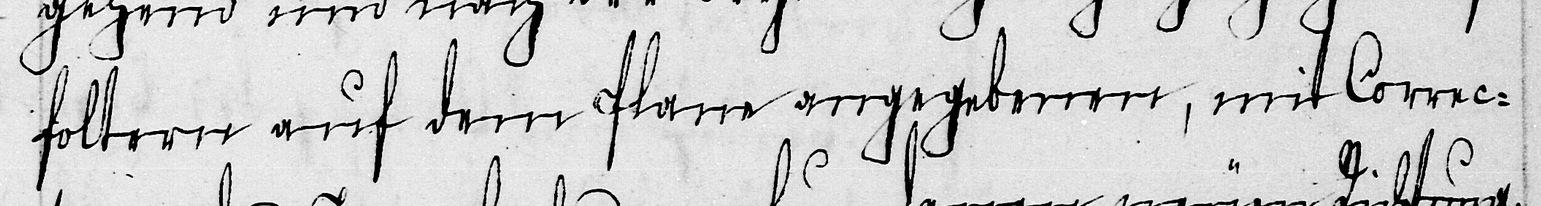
foltern auf dem Plane angegebenen, mit Correc¬
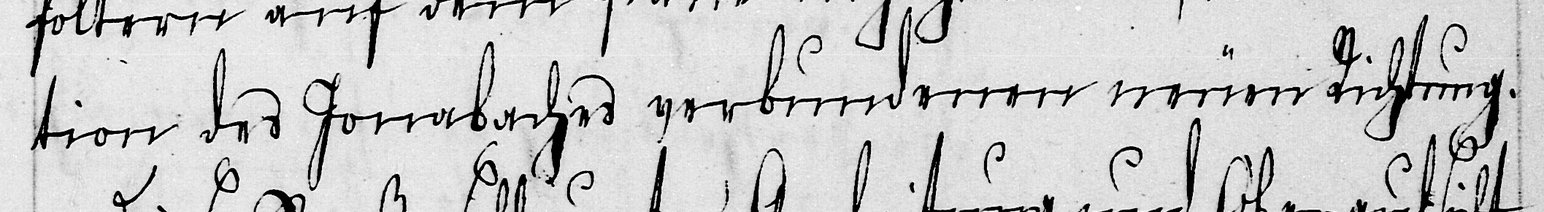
tion des Jonabaches verbundenen neuen Richtung.
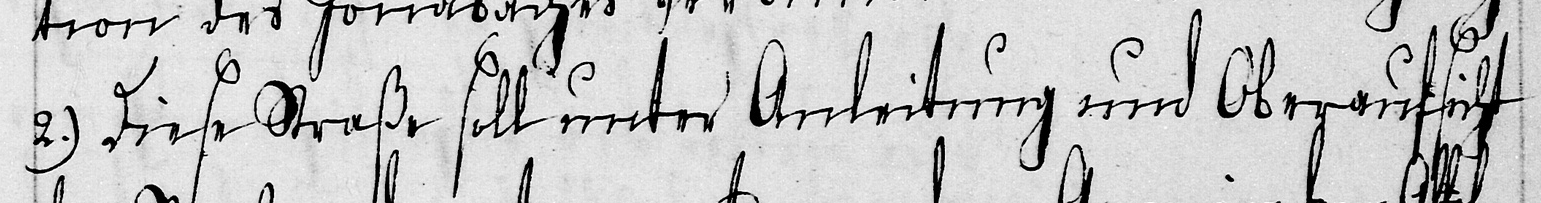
2.) Diese Straße soll unter Anleitung und Oberaufsicht
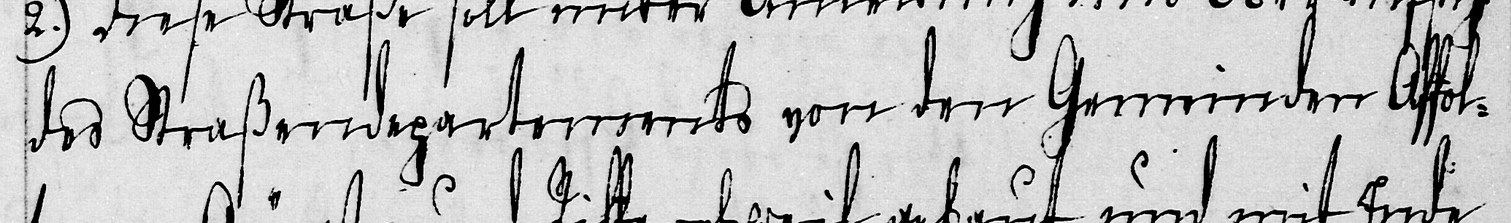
des Straßendepartements von den Gemeinden Affol¬
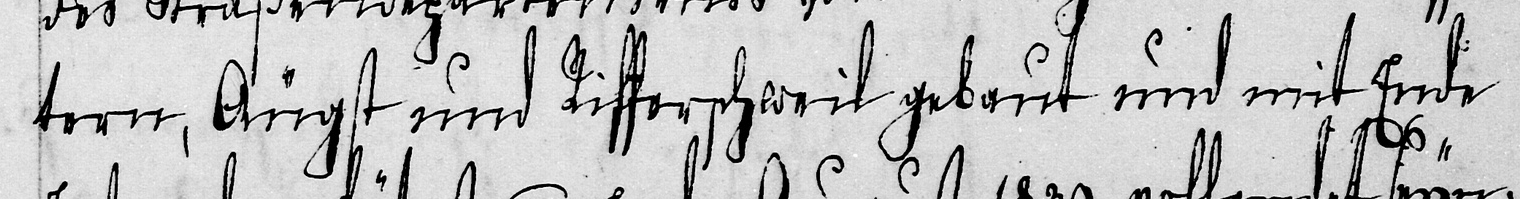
tern, Äugst und Rifferschweil gebaut und mit Ende
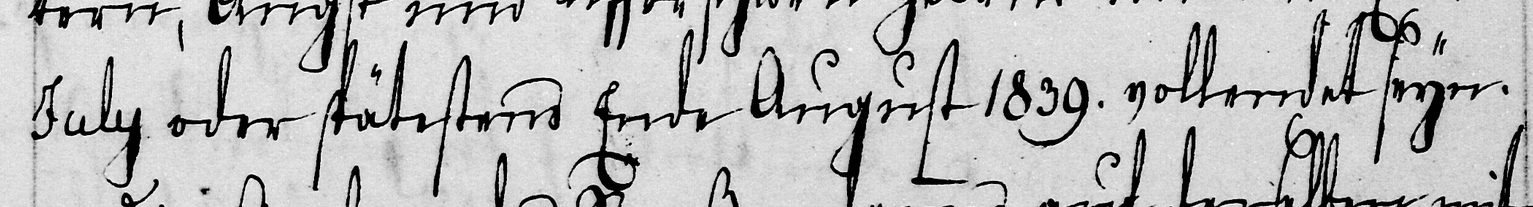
July oder spätestens Ende August 1839. vollendet seyn.
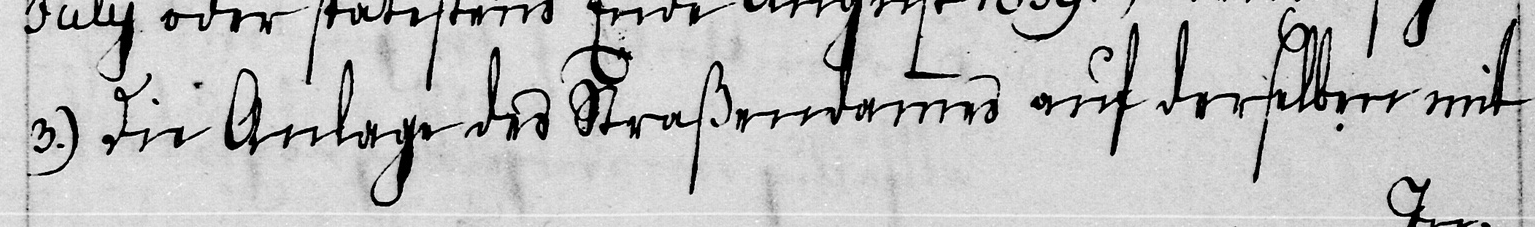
3.) Die Anlage des Straßendammes auf derselben mit
